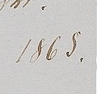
1865
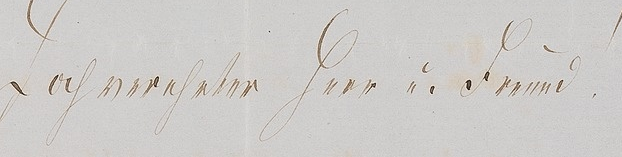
Hochverehrter Herr u. Freund!
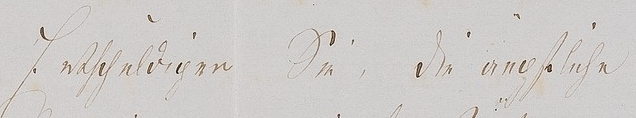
Entschuldigen Sie, die ängstliche
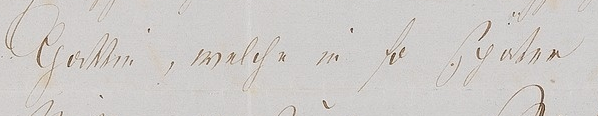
Gattin, welche in so später
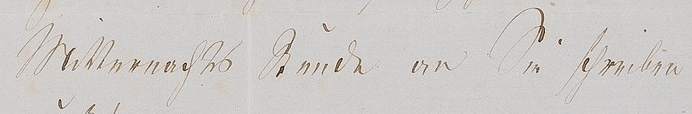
Mitternachts Stunde an Sie schreiben
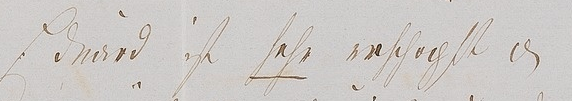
Eduard ist sehr erschöpft &
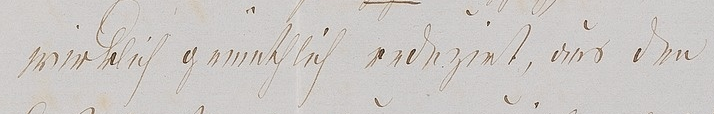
wirklich gemüthlich reduzirt, aus den
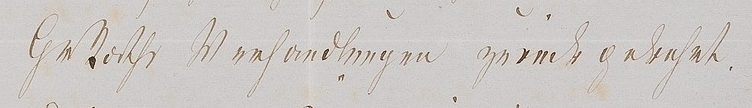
Gr Raths Verhandlungen zurück gekehrt.
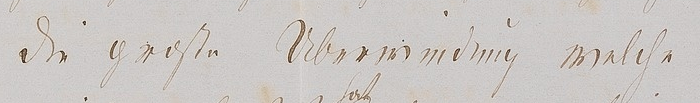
Die große Überwindung welche
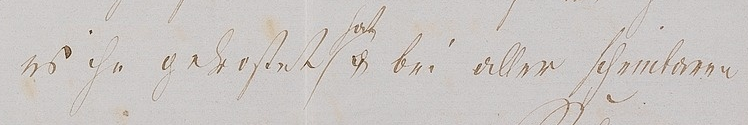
es ihn gekostet hat & bei aller scheinbaren
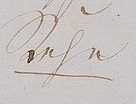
Ruhe,
